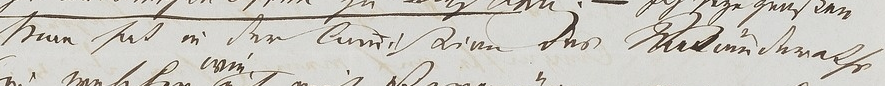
Man hat in der Commission des Ständeraths
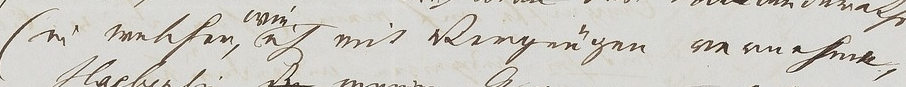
(in welcher, wie ich mit Vergnügen vernehme,
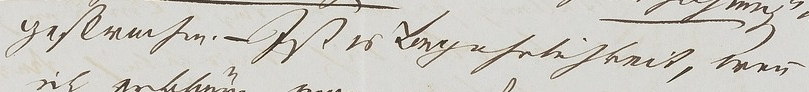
gesprochen. – Ist es Begehrlichkeit, wenn
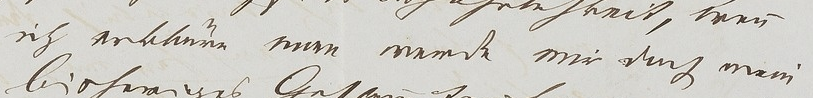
ich erkläre man werde mir doch mein
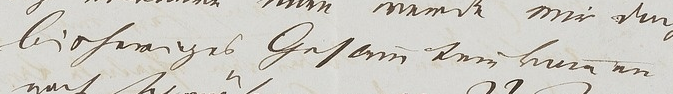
bisheriges Gesammteinkommen
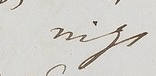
nicht
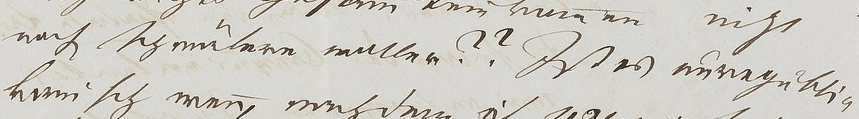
noch schmälern wollen?? Ist es unrepubli-
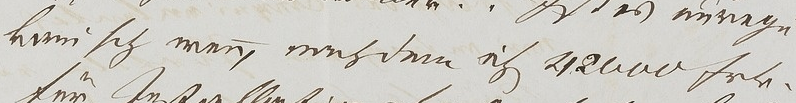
kanisch wenn, nachdem ich 42000 frk.
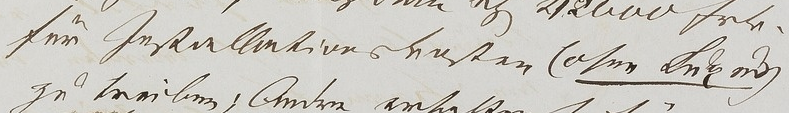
für Installationskosten (ohne Luxus
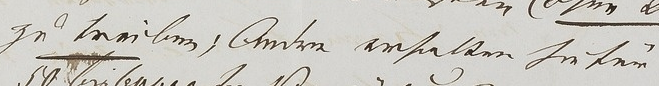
zu treiben; Andre erhalten hiefür
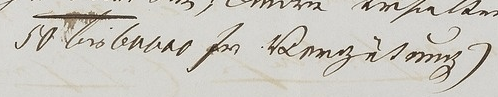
50 bis 60000 fr. Vergütung)
